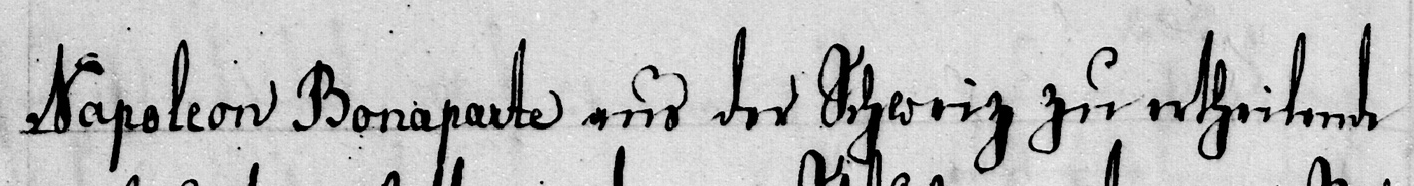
Napoleon Bonaparte aus der Schweiz zu ertheilende
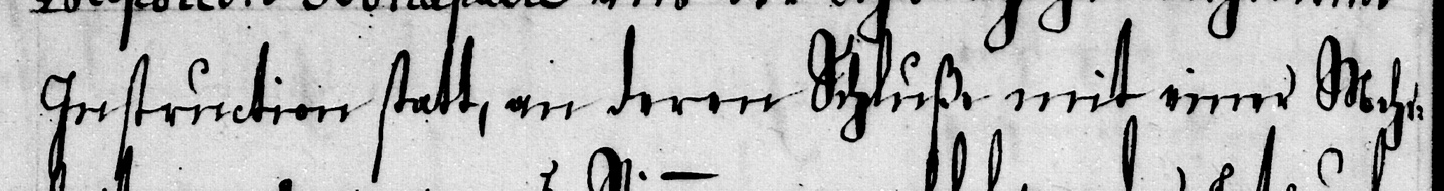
Instruction statt, an deren Schluße mit einer Mehr¬
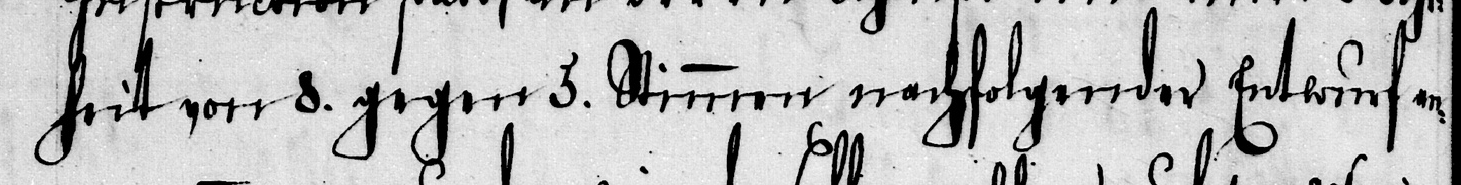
heit von 8. gegen 5. Stimmen nachfolgender Entwurf a¬
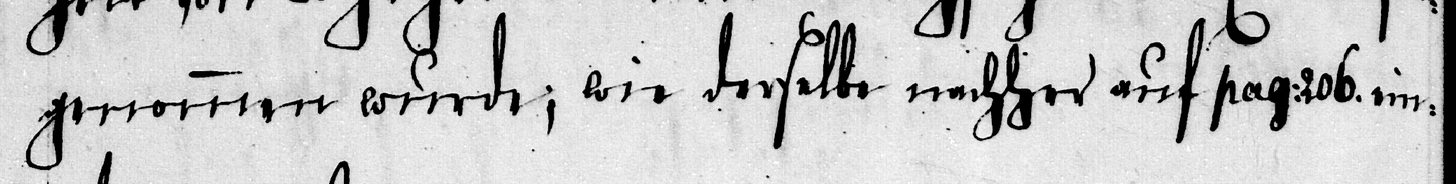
ngenommen wurde; wie derselbe nachher auf pag: 206. ein¬
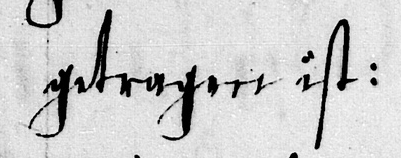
getragen ist:
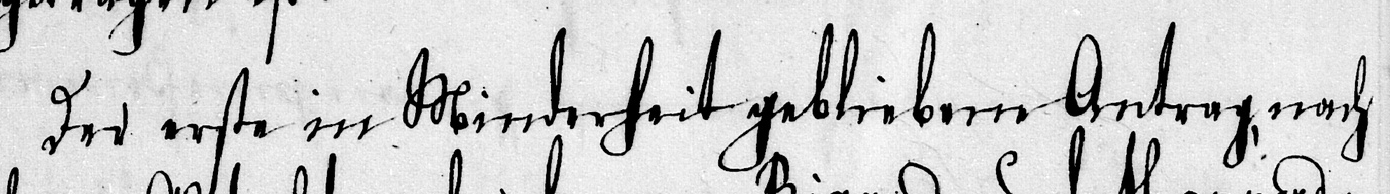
Der erste in Minderheit gebliebene Antrag, nach
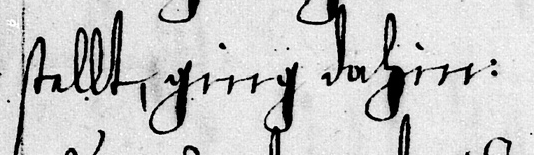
stellt, ging dahin:
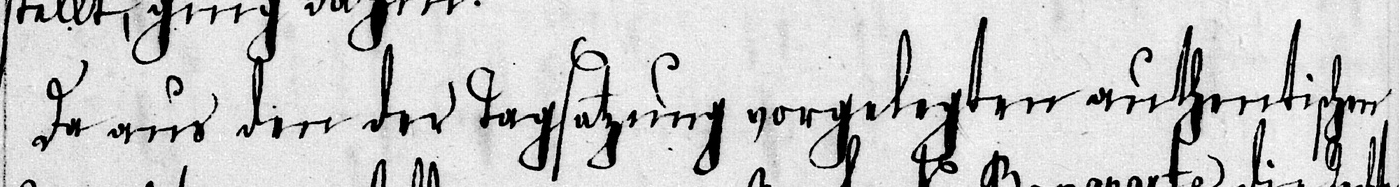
Da aus den der Tagsatzung vorgelegten authentischen
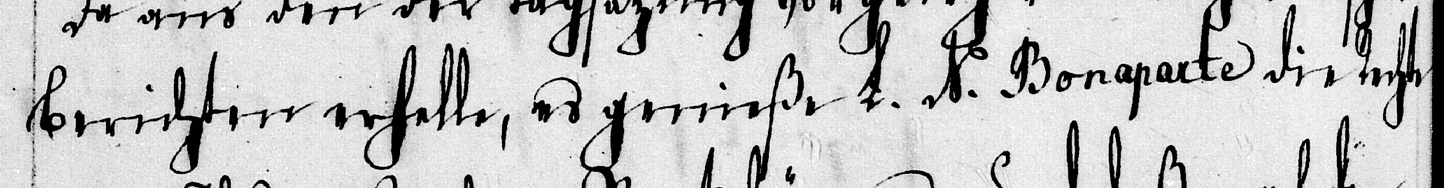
Berichten erhelle, es genieße L. N. Bonaparte die Rechte
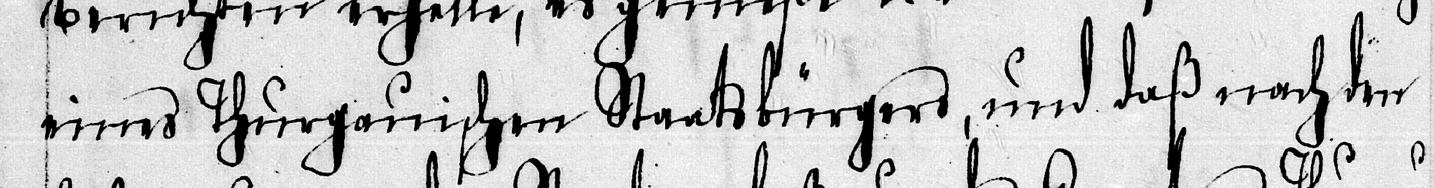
eines Thurgauischen Staatsbürgers, und daß nach den
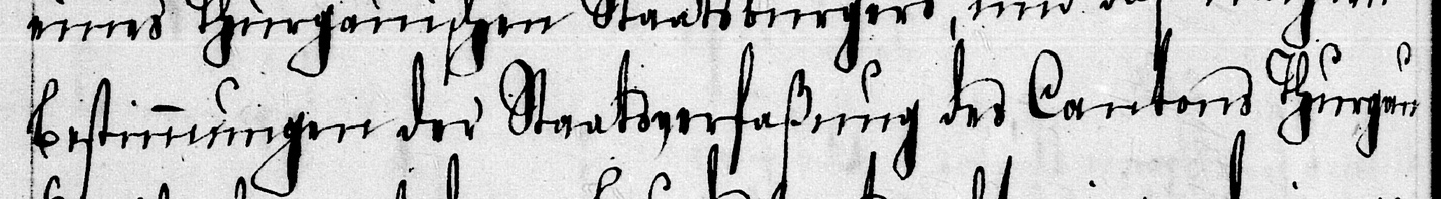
Bestimmungen der Staatsverfaßung des Cantons Thurgau
